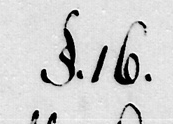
§. 16.
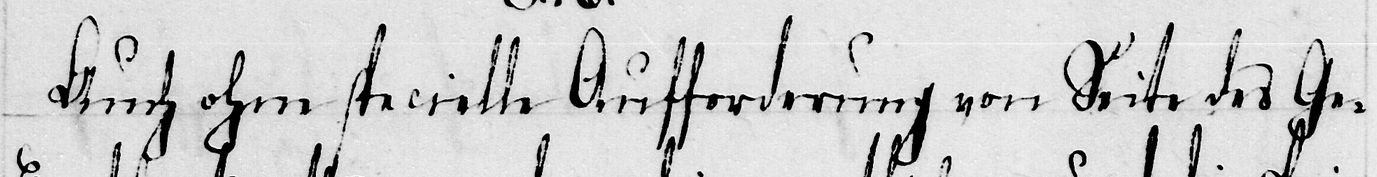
Auch ohne specielle Aufforderung von Seite des Ge¬
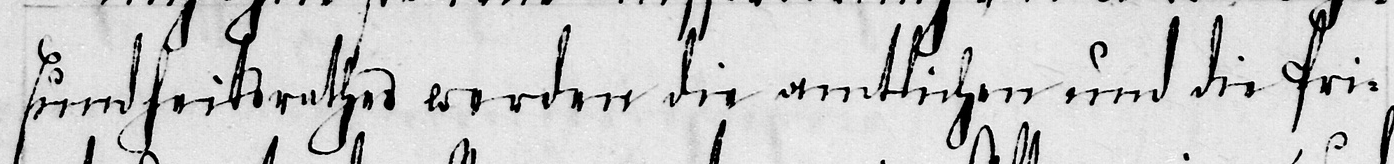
sundheitsrathes werden die amtlichen und die Pri¬
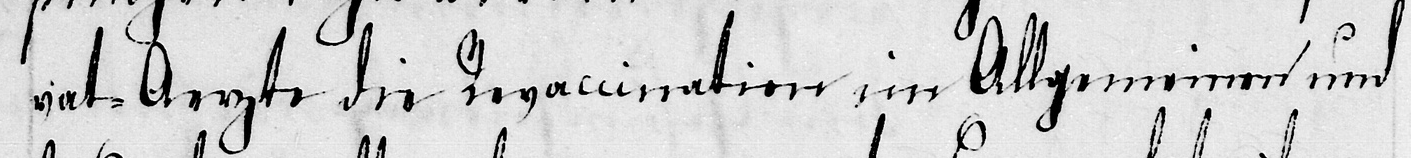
vat-Aerzte die Revaccination im Allgemeinen und
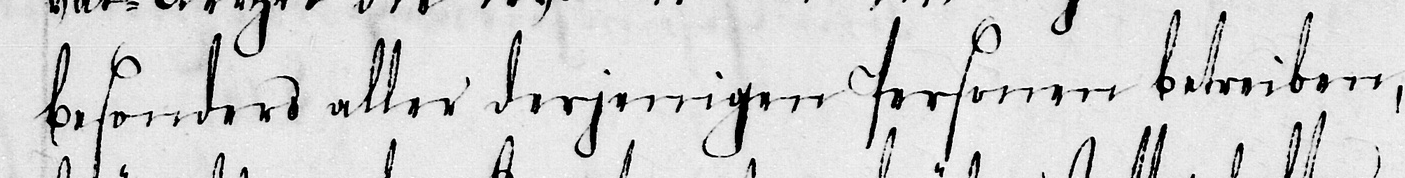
besonders aller derjenigen Personen betreiben,
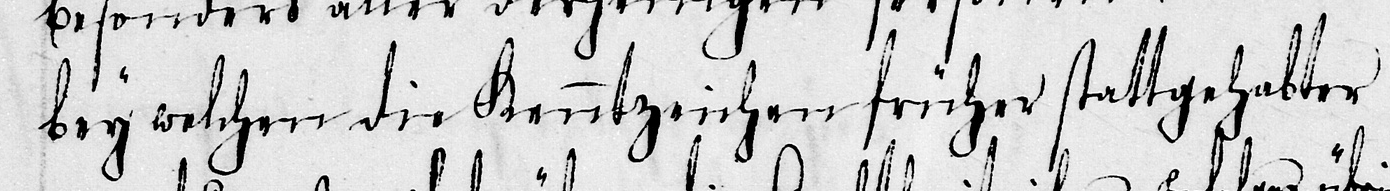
bey welchen die Kenntzeichen früher stattgehabter
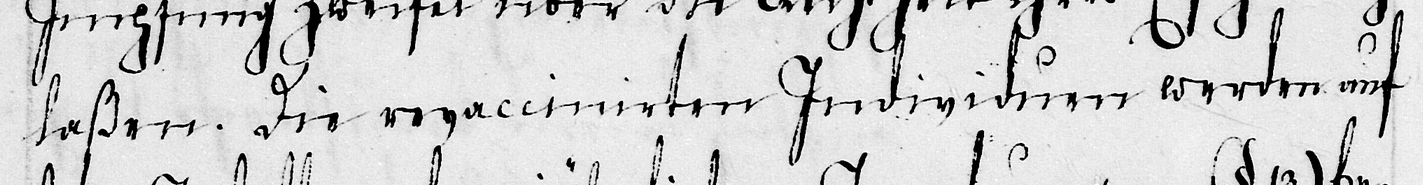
laßen. Die revaccinirten Individuen werden auf
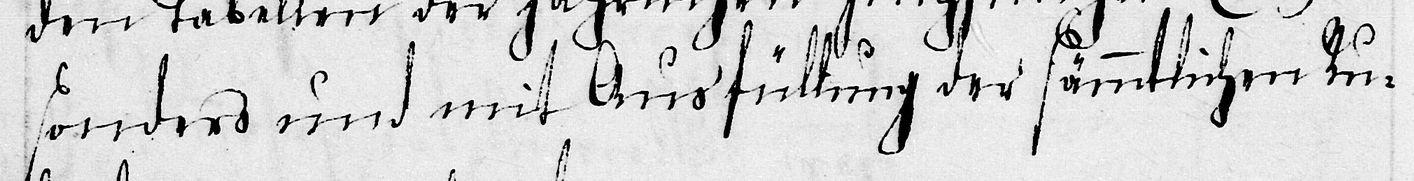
sonders und mit Ausfüllung der sämmtlichen Ru¬
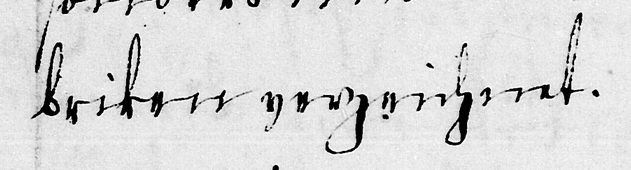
briken verzeichnet.
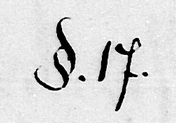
§. 17.
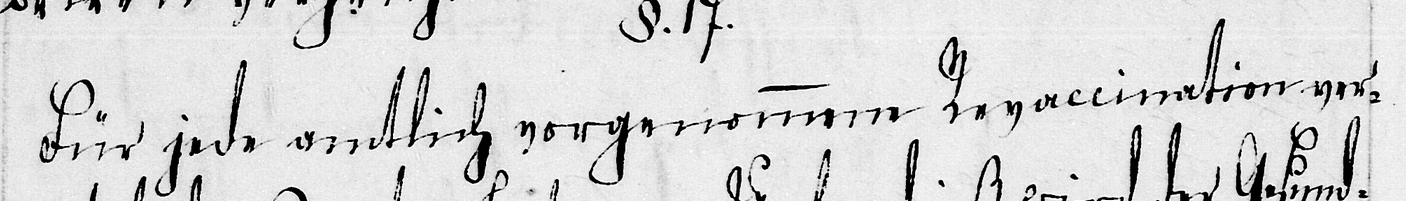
Für jede amtlich vorgenommenen Revaccination ver¬
